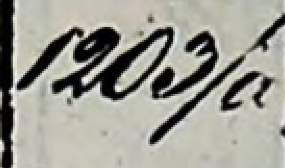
1203/a
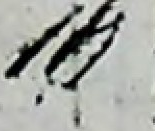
16
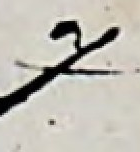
7
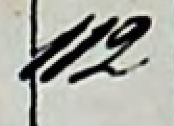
112
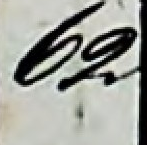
62
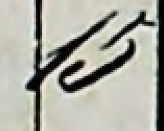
15
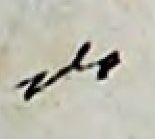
do
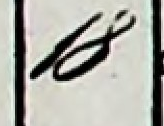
18
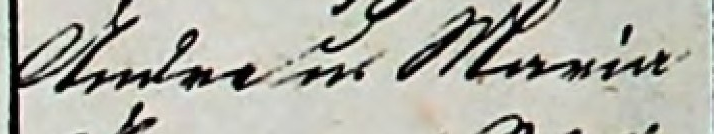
Andre u. Maria
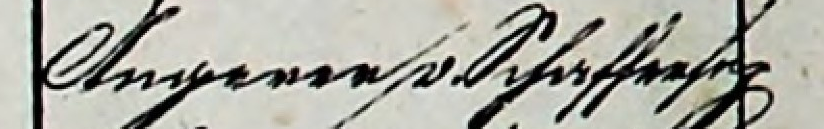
Angerer v. Schafferseg
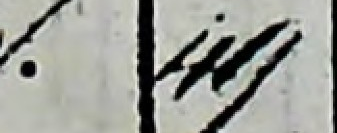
./. 119
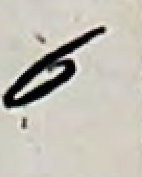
6
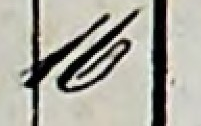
16
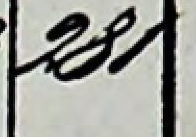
281
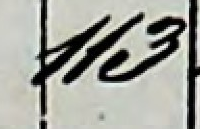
113
